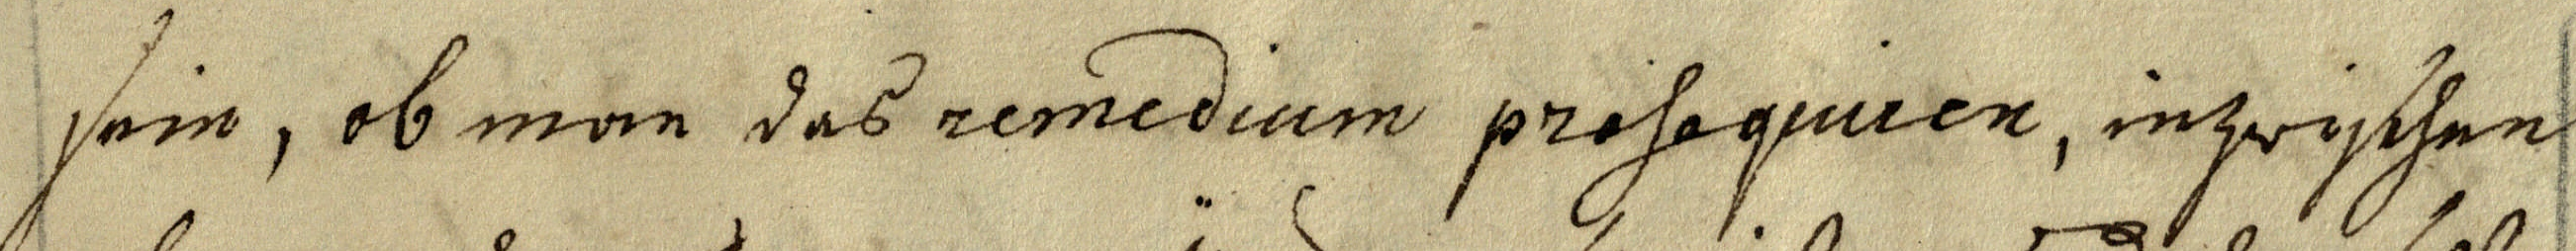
sein, ob man das remedium prosequiren, inzwischen
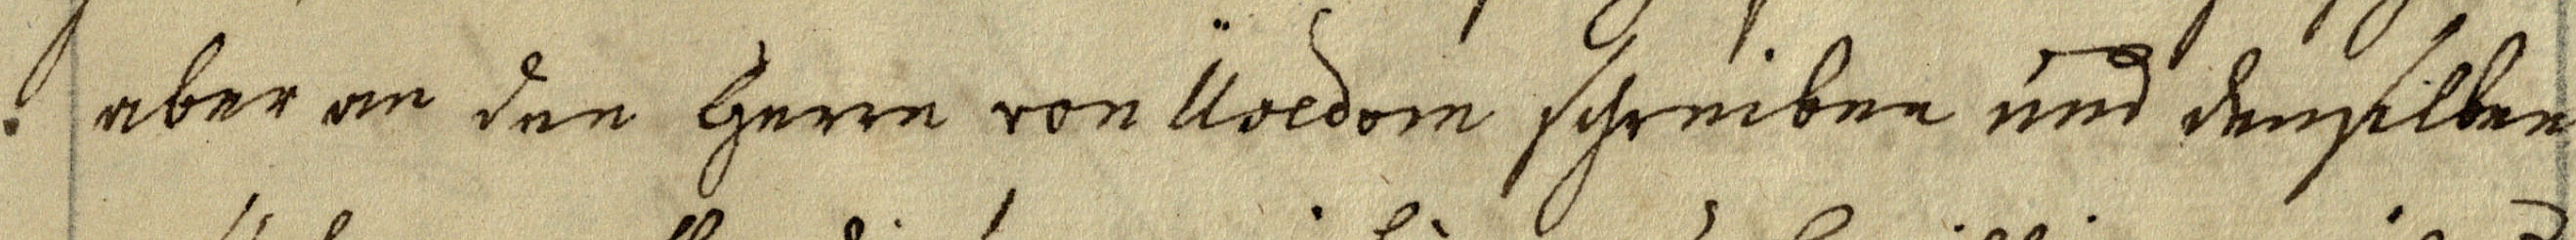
aber an den Herrn von Usedom schreiben und denselben
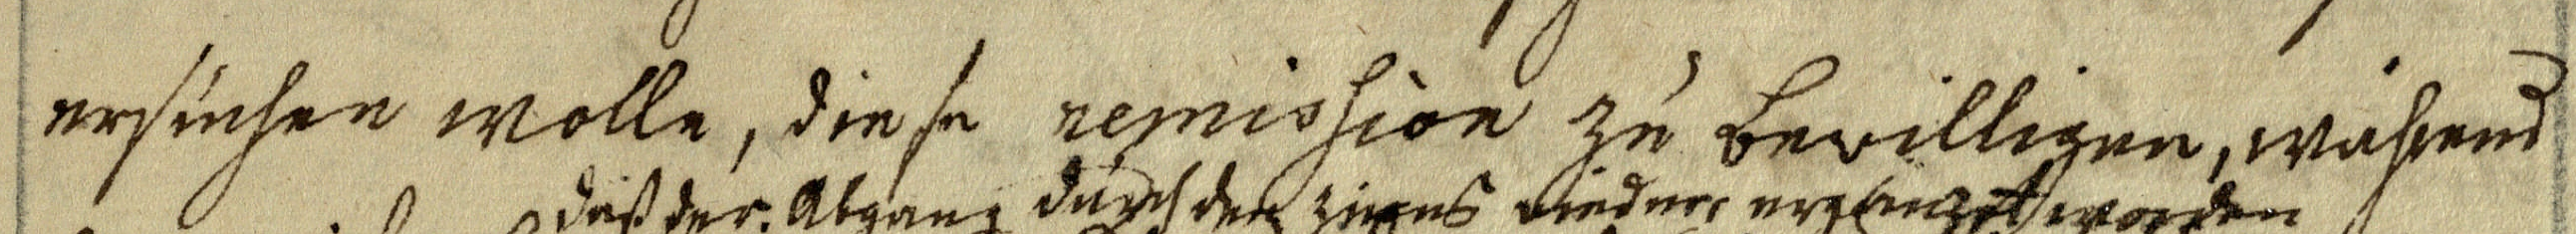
ersuchen wolle, diese remission zu bewilligen, während
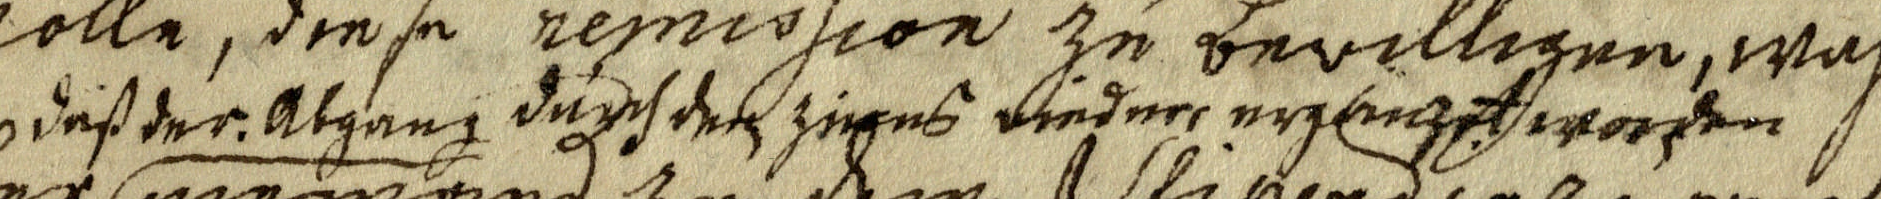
daß der Abgang durch den zinns wieder ergänzet worden
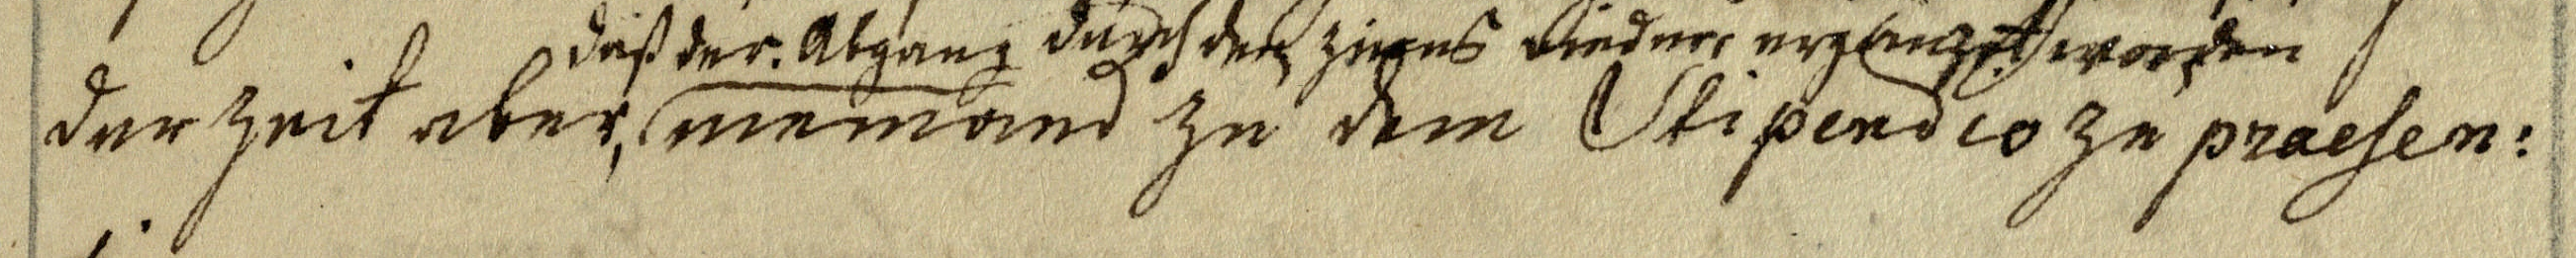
der Zeit aber niemand zu dem Stipendio zu praesen¬
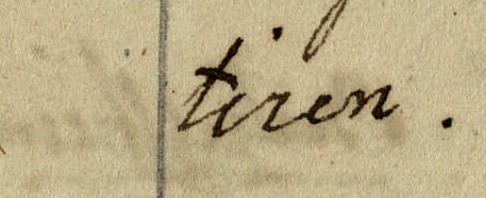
tiren.
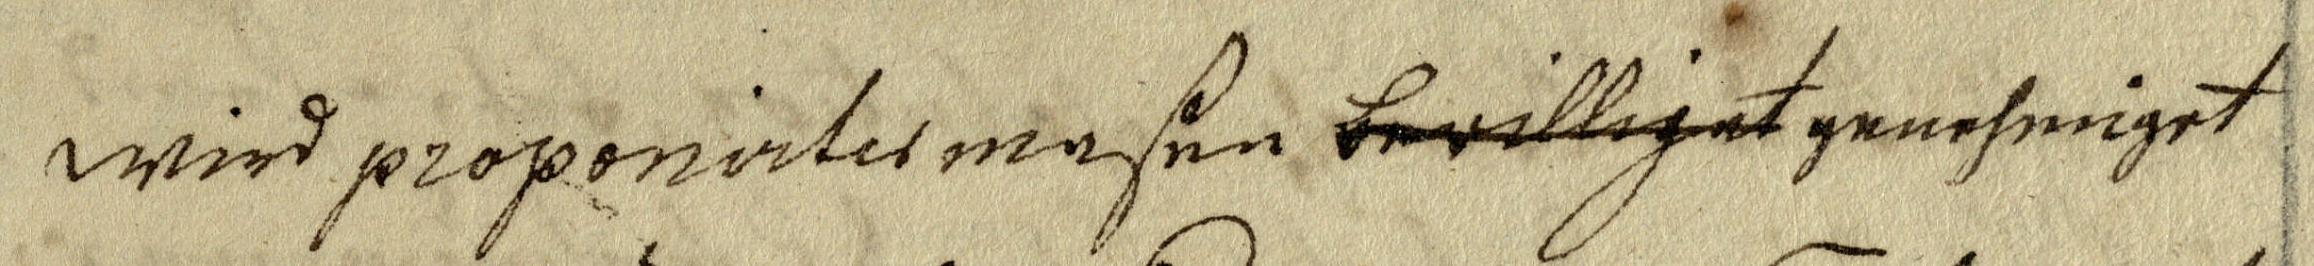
wird proponirter maßen bewilliget genehmiget
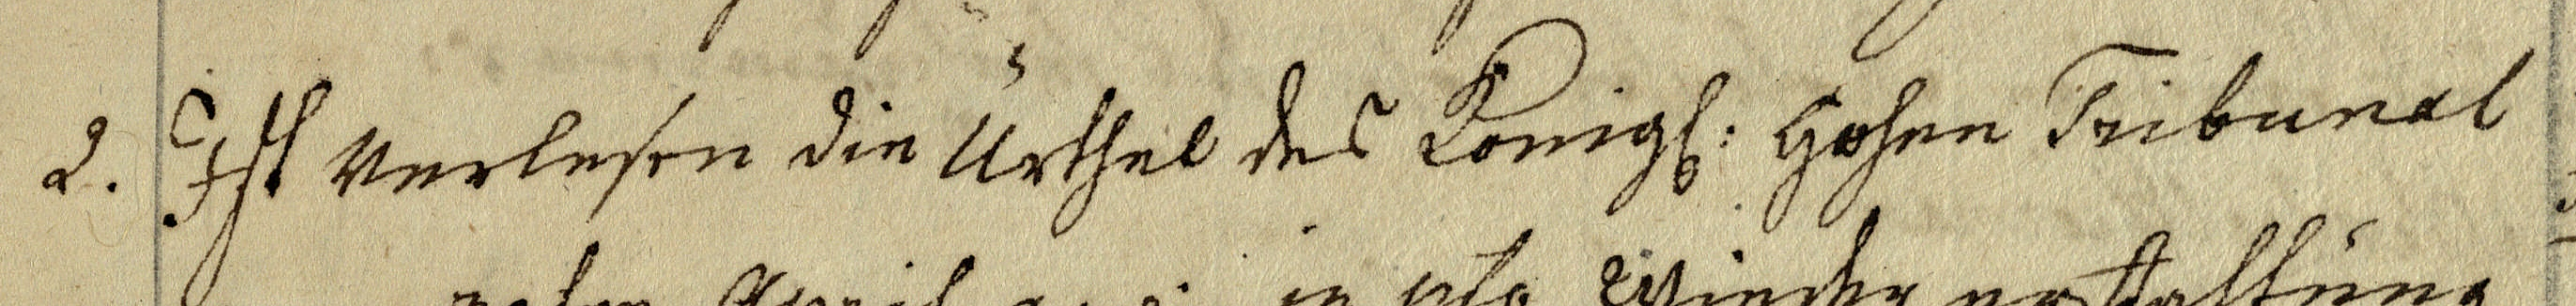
2. Ist verlesen die Urthel des Königl: Hohen Tribunal
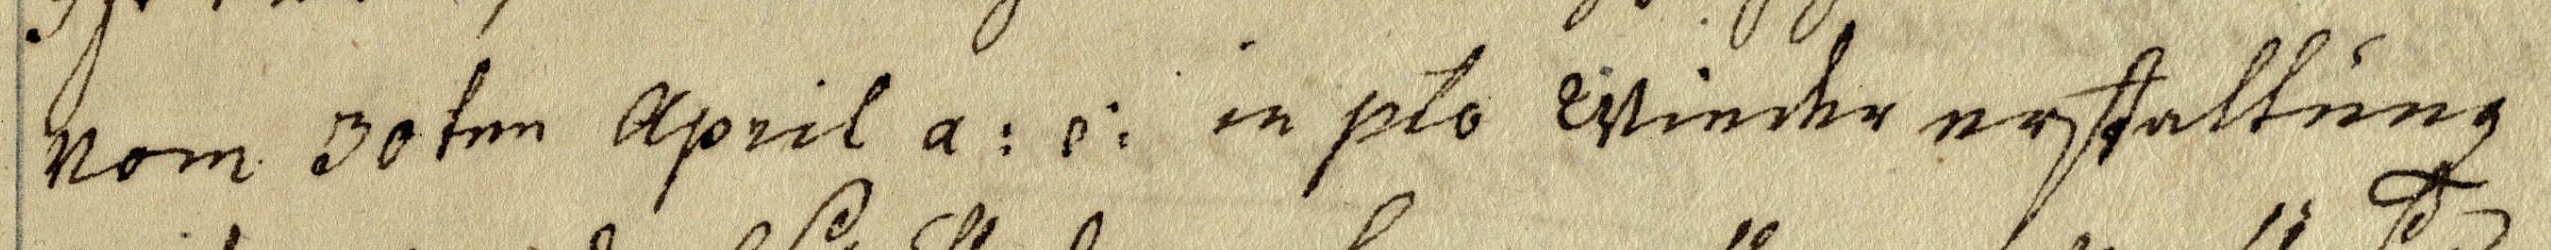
vom 30ten April a: c: in pto Wieder erstattung
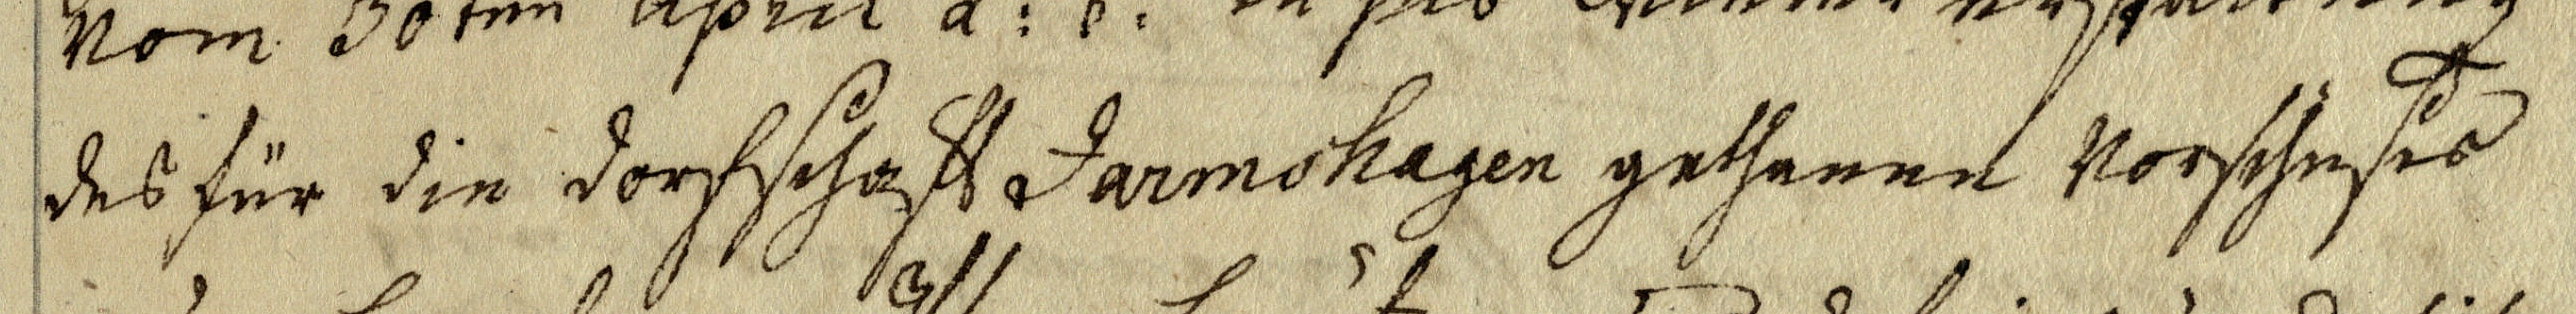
des für die Dorfschaft Jarmshagen gethanen Voschußes
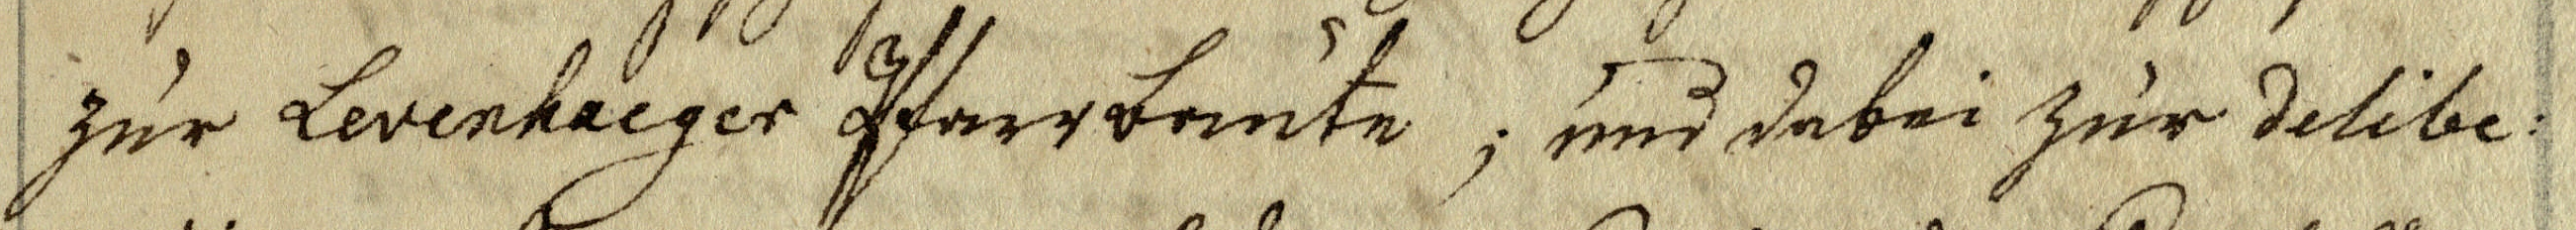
zur Levenhaeger PfarrBaute; und dabei zur delibe¬
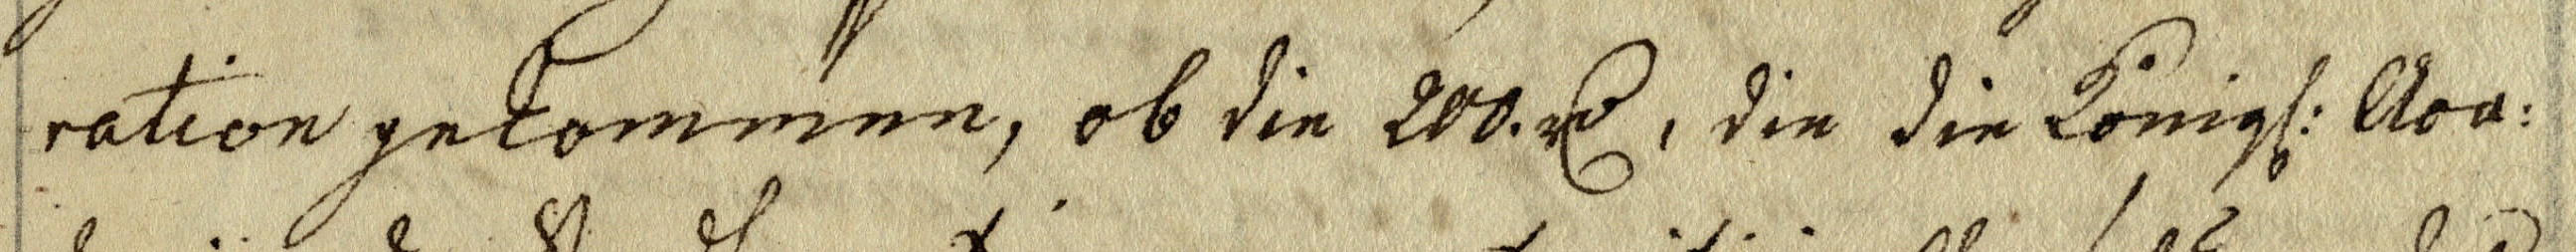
ration gekommen, ob die 200. r , die die Königl: Aca¬
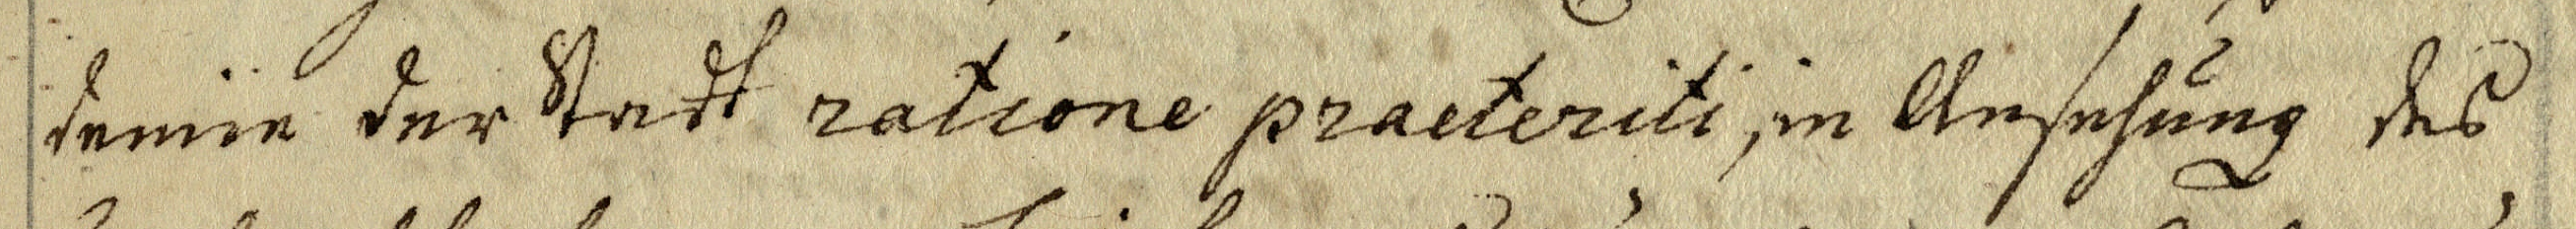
demie der Stadt ratione praeteriti in Ansehung des
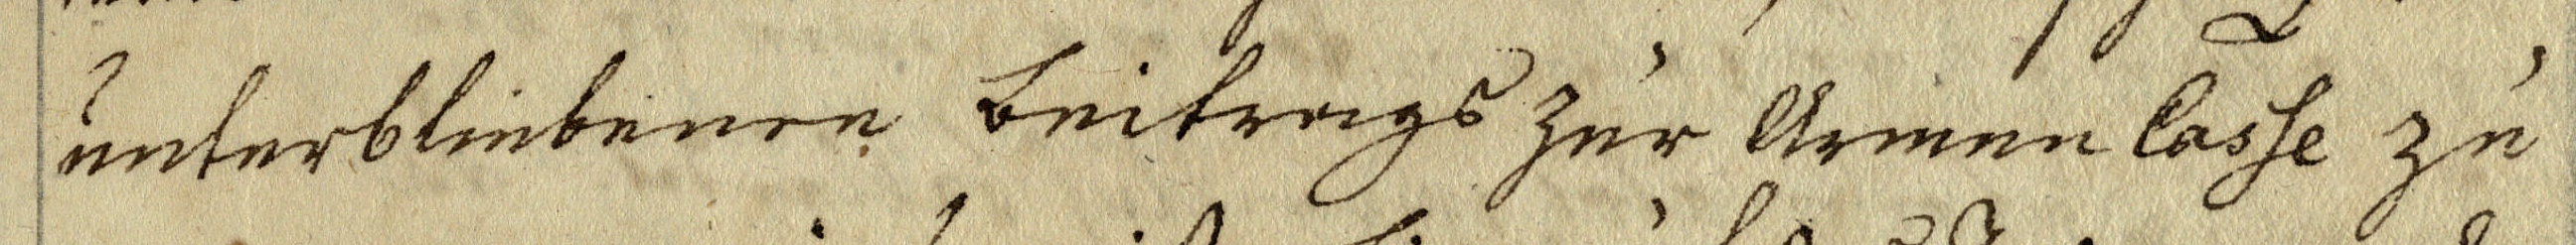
unterbliebenen Beitrags zur Armen Casse zu
